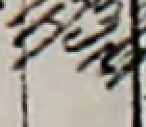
473,?
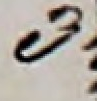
3
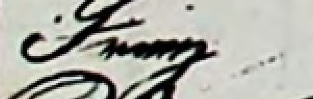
Franz
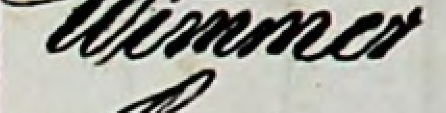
Wimmer
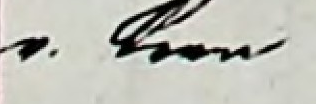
v. Kern
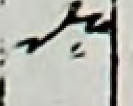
Do
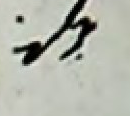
Do
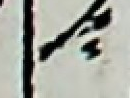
Do
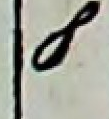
8
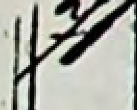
71
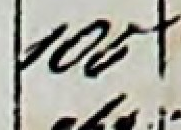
105
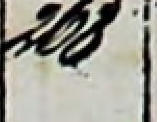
268
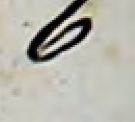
6
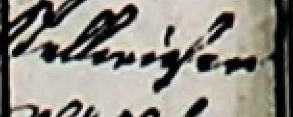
Stellwiesen
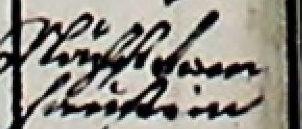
Nächst ???
